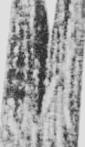逆
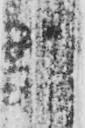訓（順）
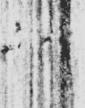之
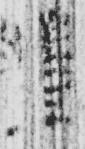○（體）
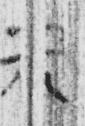亓（其）
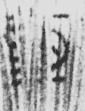宜（義）
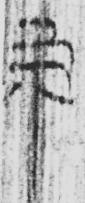而
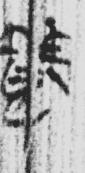節
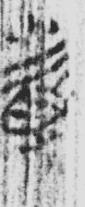○（文）
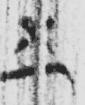之
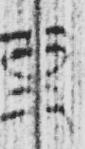里（理）
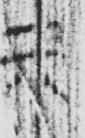亓（其）
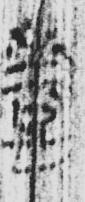情
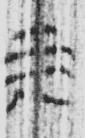而
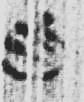出
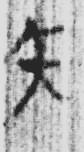内（入）
